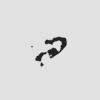可
